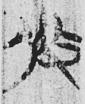攸（修）
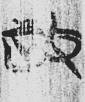政
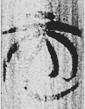而
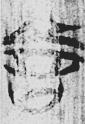善
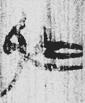於
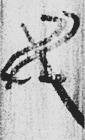民
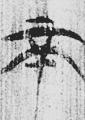不
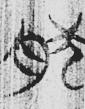○（然）
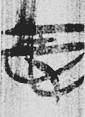○（任）
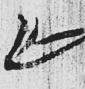亡
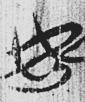{女匕}（焉）
